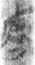膚（盧）
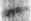一
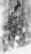禺（偶）
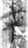才（在）
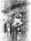{匚去}
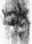{阝咸}
